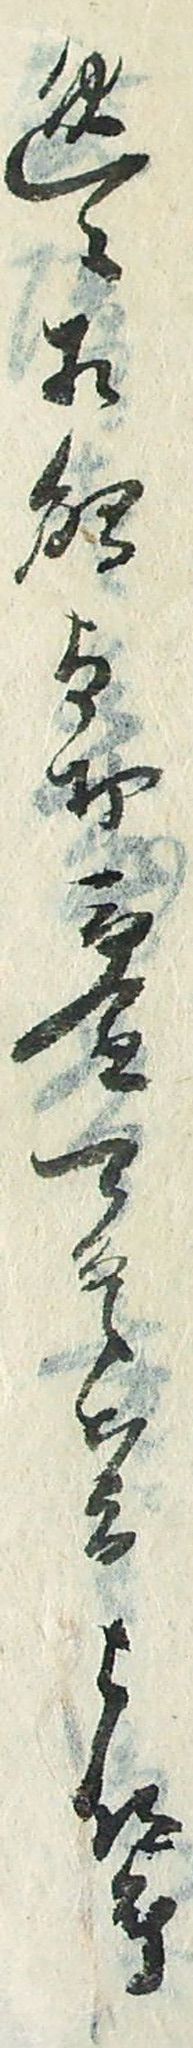逸々相触与切受書可差出旨被仰付

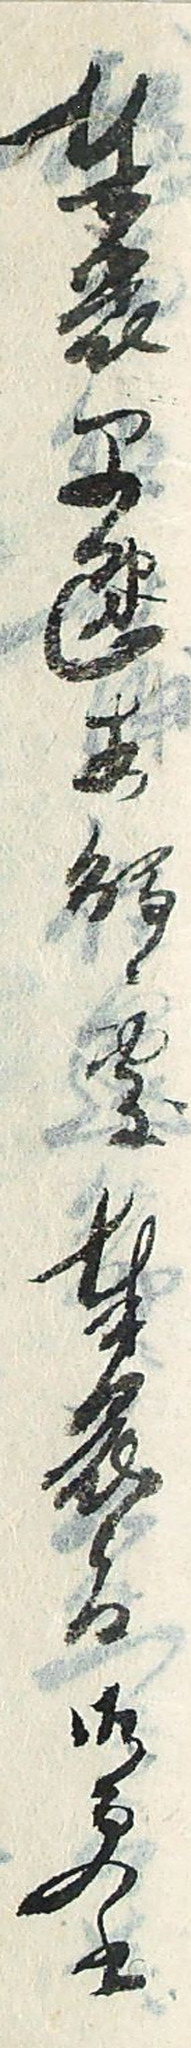奉畏早速相触候処奉畏旨御受書
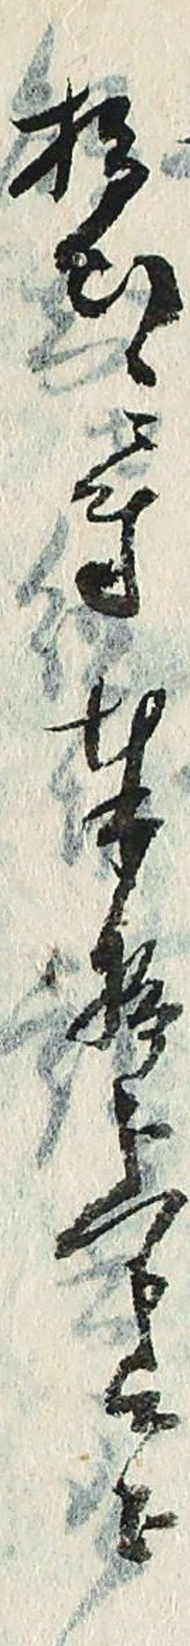指出候に付奉指上申候以上
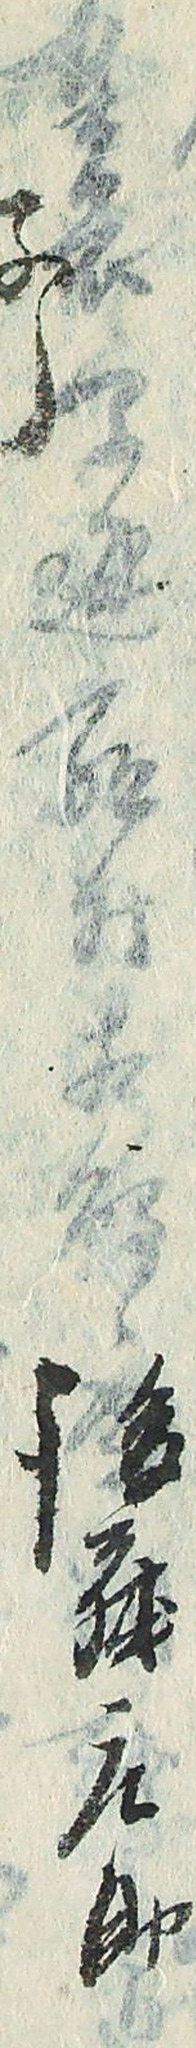後藤庄助
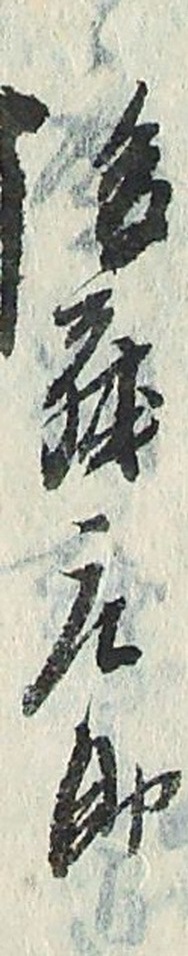後藤庄助
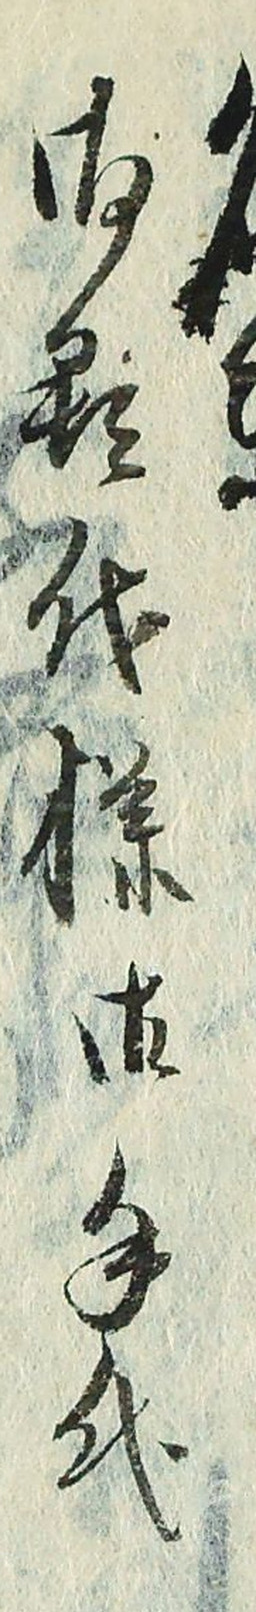御郡代様御手代
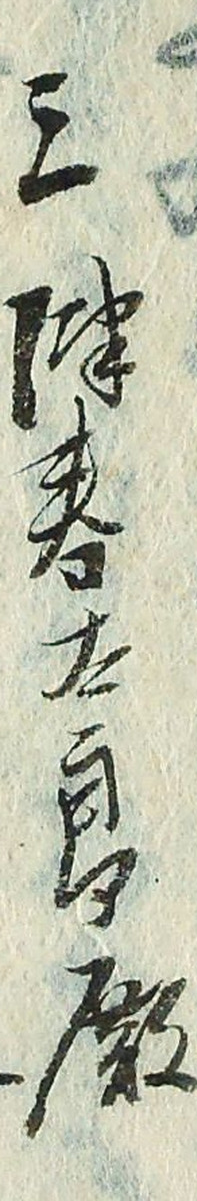三沢春太郎殿
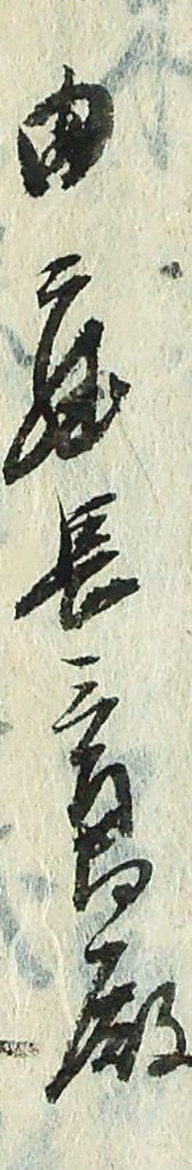内藤長三郎殿
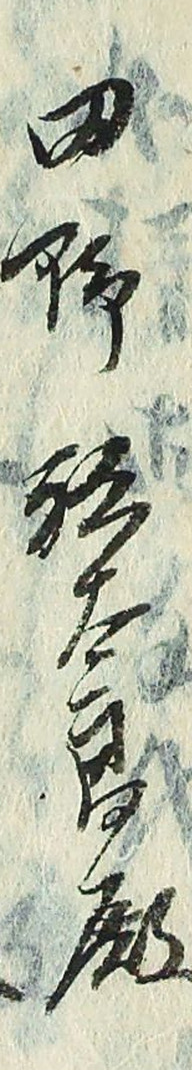田野祐太郎殿
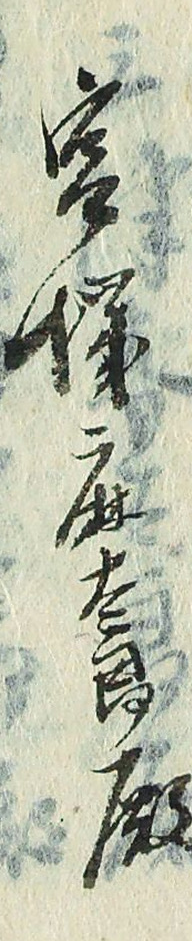宮城麻太郎殿
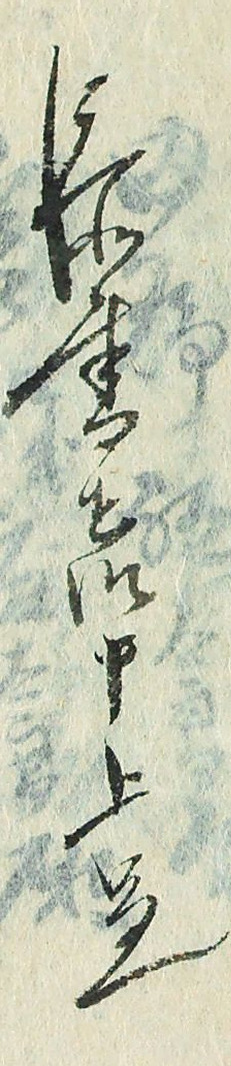添書を以申上覚
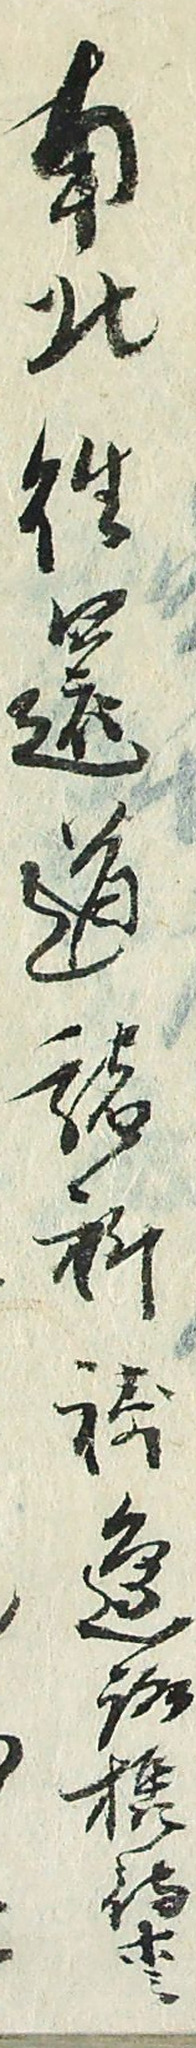南北往還道諸祈祷遍路摂待等之
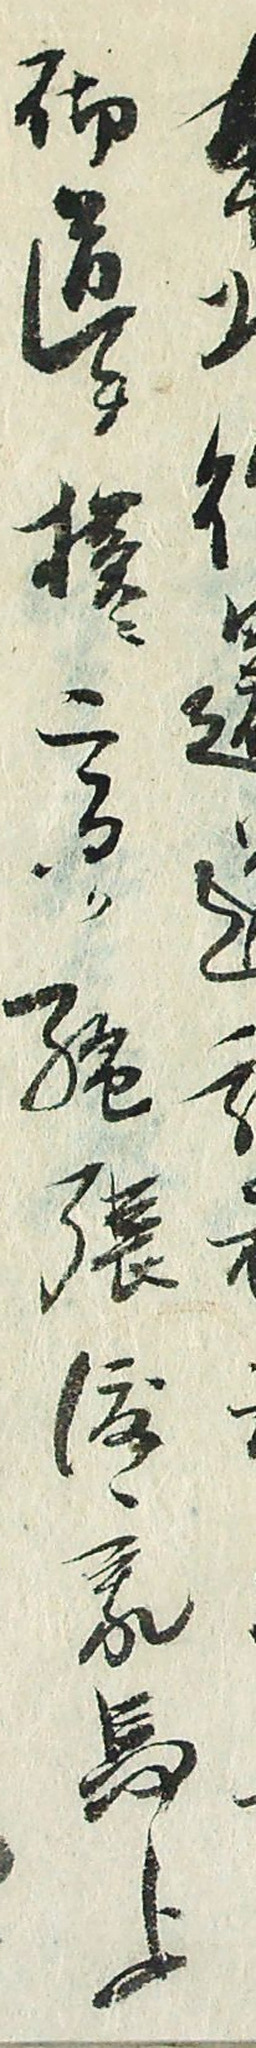砌道を横に高く縄張渡候義馬上
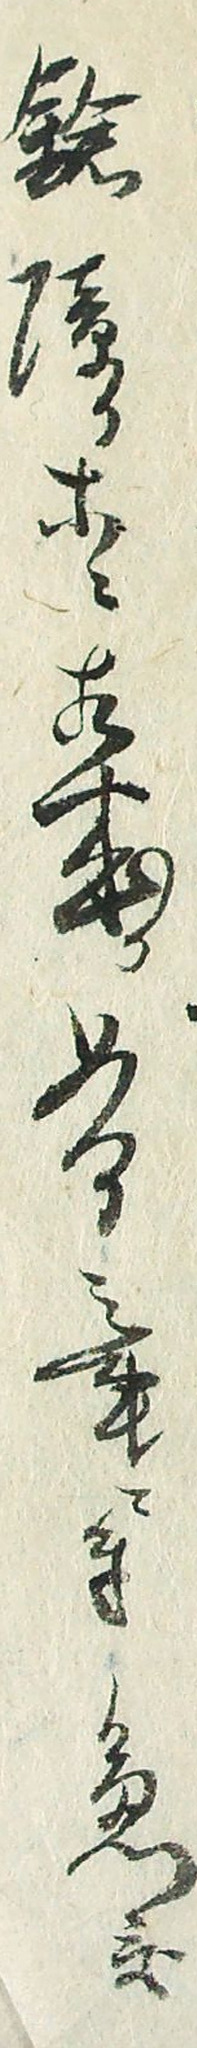鎗障り等に相成り如何之事に付急度

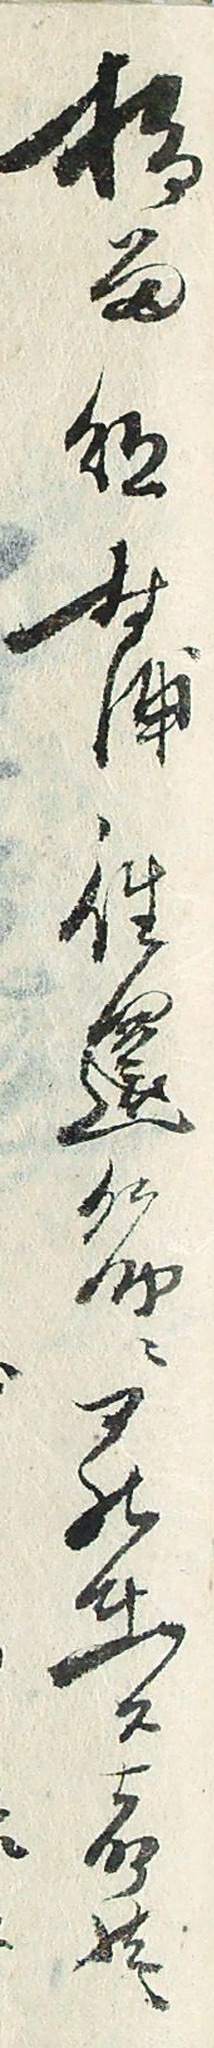指留組村浦往還筋に罷在候者共へ
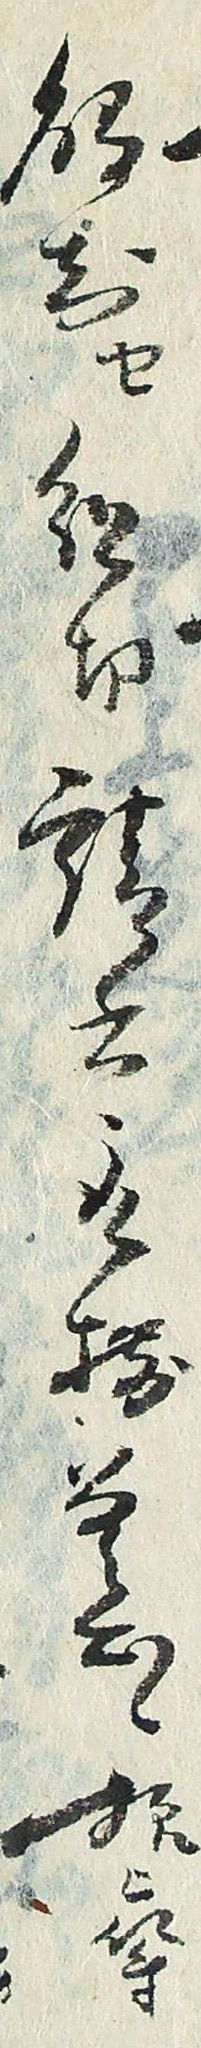触知せ組切請書取揃差出候様被仰付
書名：諸御用御□受書控
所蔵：鳴門教育大学 Naruto University of Education
